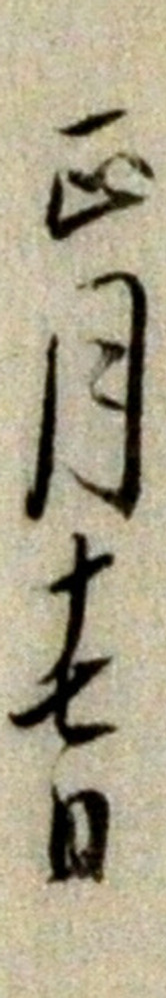正月十七日
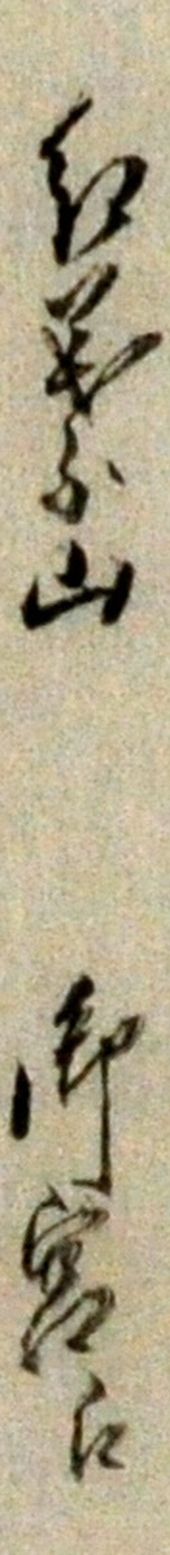紅葉山御宮え
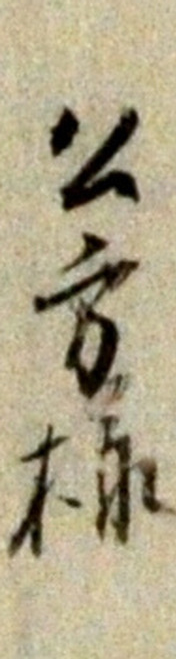公方様
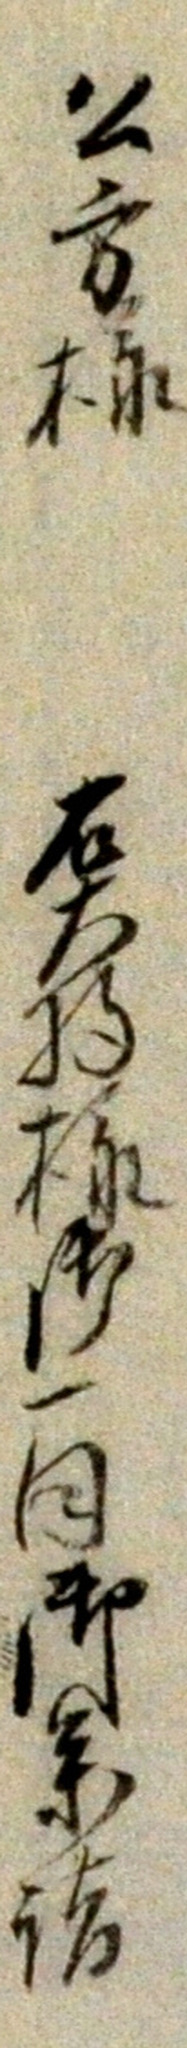公方様右大将様御一同御参詣
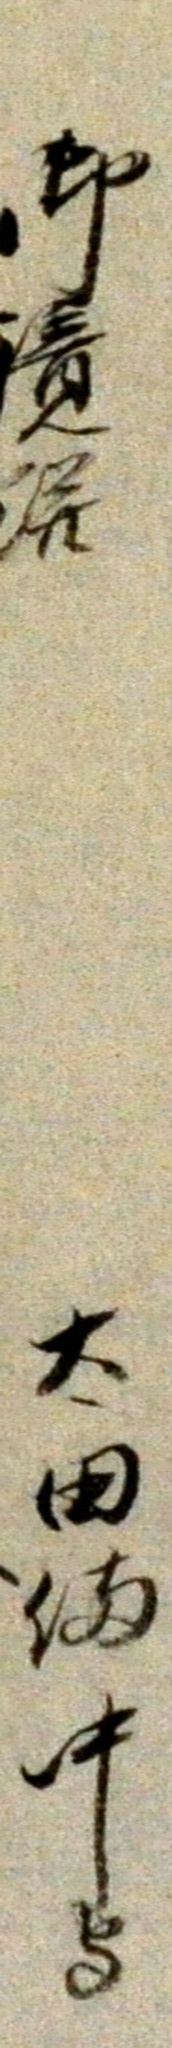御鏡餅太田備中守
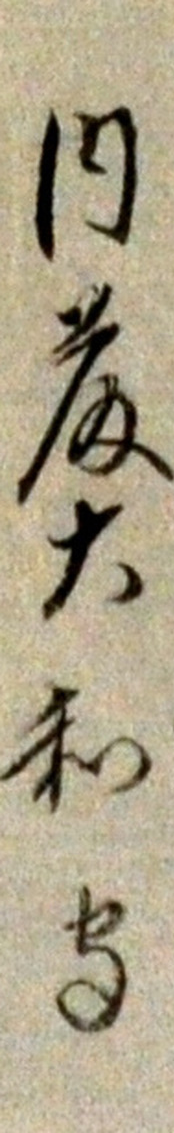内藤大和守
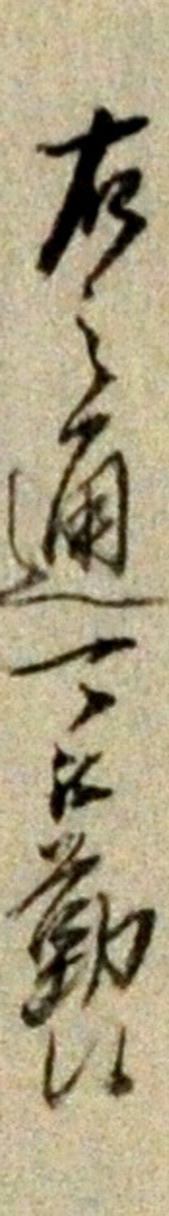左之通可被勤候
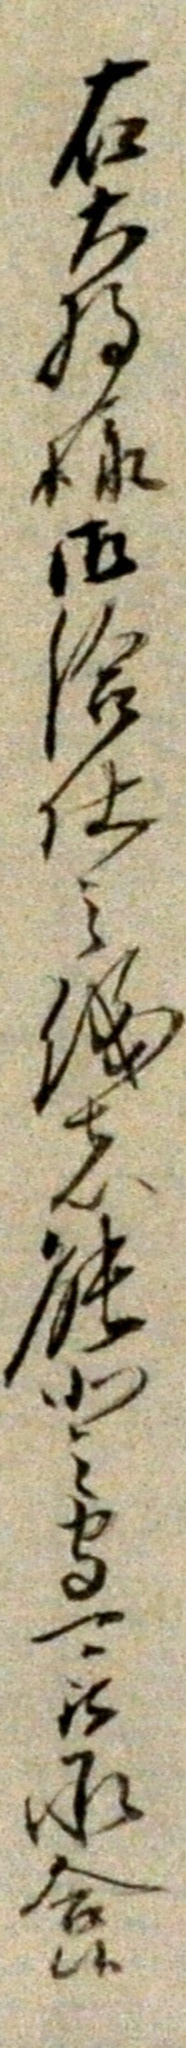右大将様御給仕之儀は能登守可被承合候
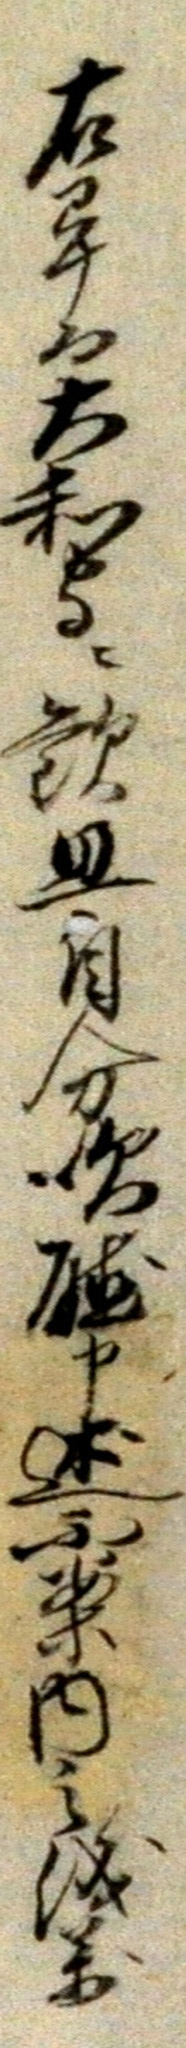右畢而大和守ニ歓且自分吹聴申述不案内之儀万
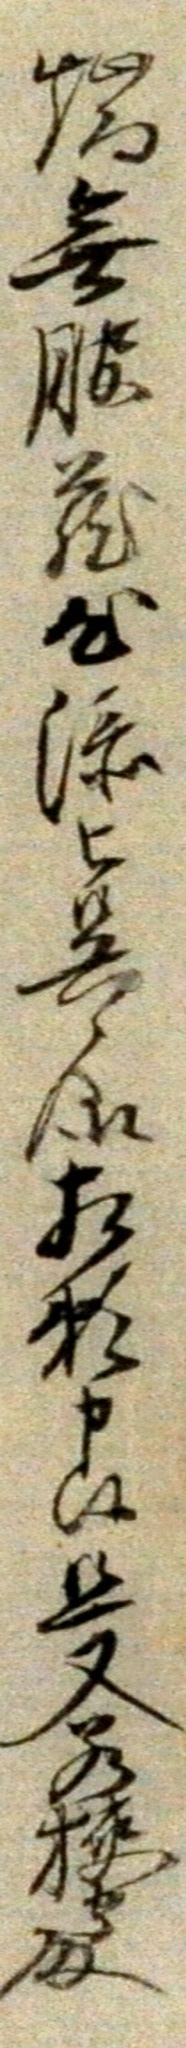端無端腹蔵心添被呉候様相頼申候且又若狭守殿
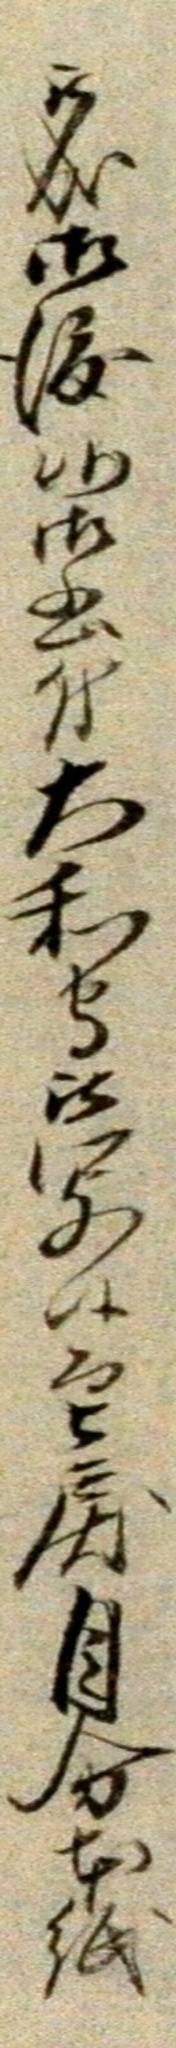被成御渡候御書付大和守被写候而被戻自分本紙
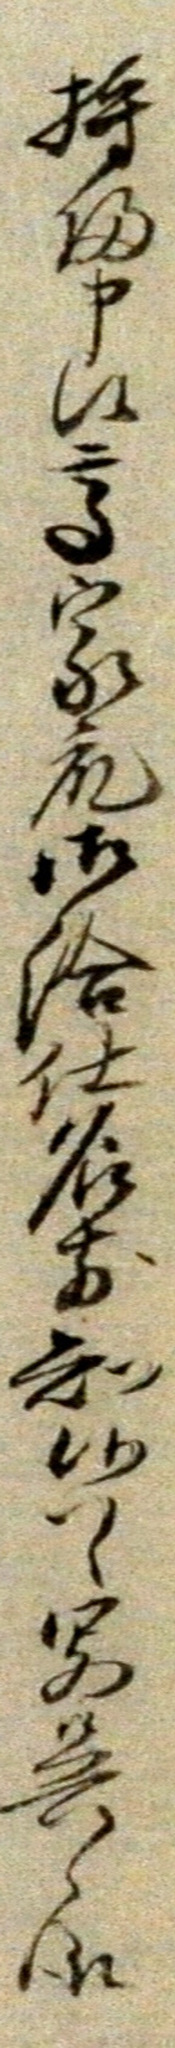持帰申候高家衆御給仕名前知候ハヽ写呉候様
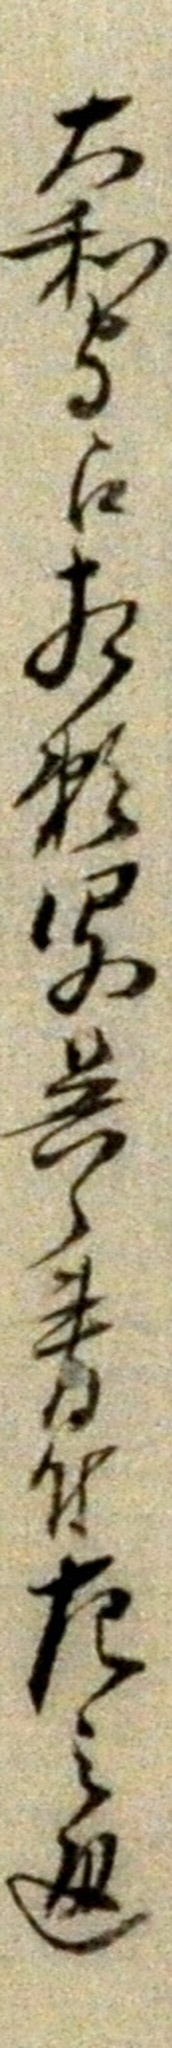大和守え相頼写呉候書付左之通
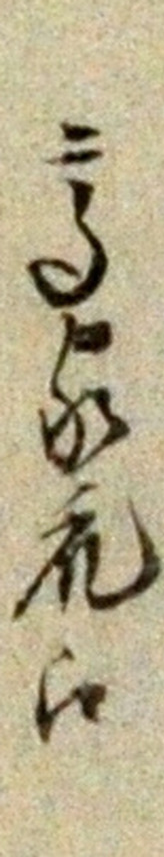高家衆え
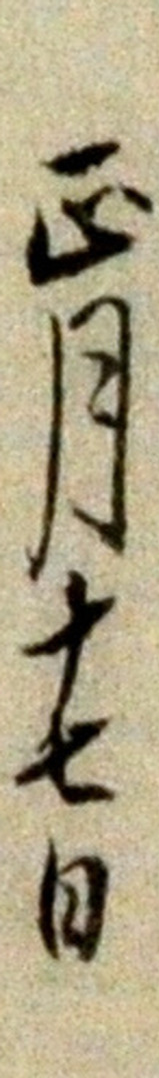正月十七日
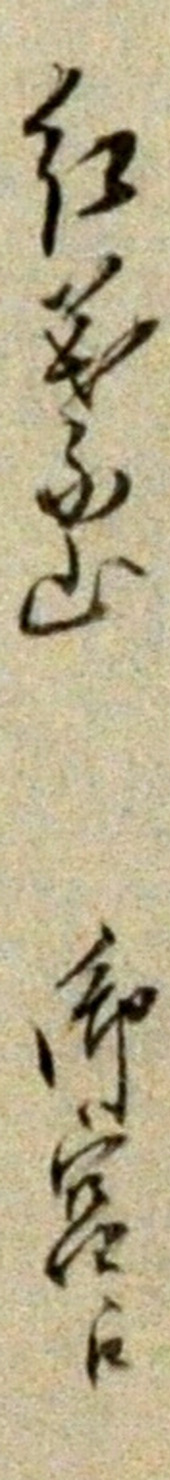紅葉山御宮え
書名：御鏡餅御用留（写）
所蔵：伊那市立高遠町図書館・合同会社AMANE
